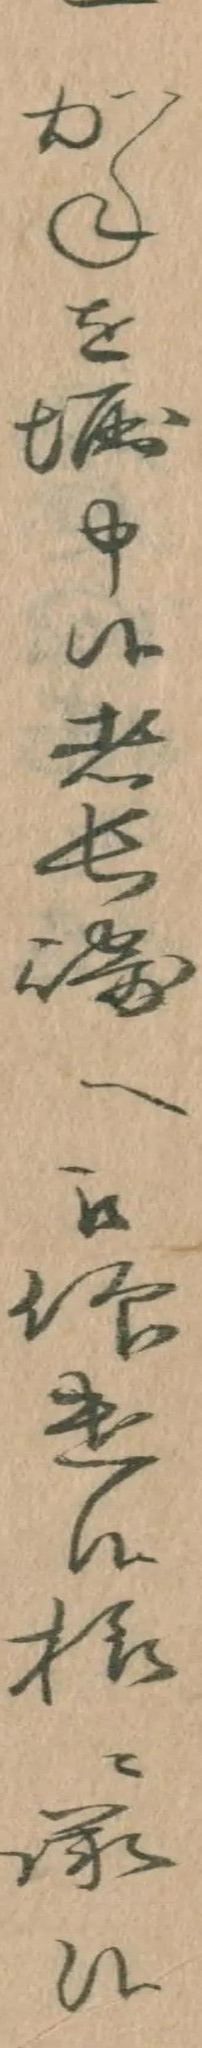一加手を堀申候者長崎へ被仰遣候様に承候
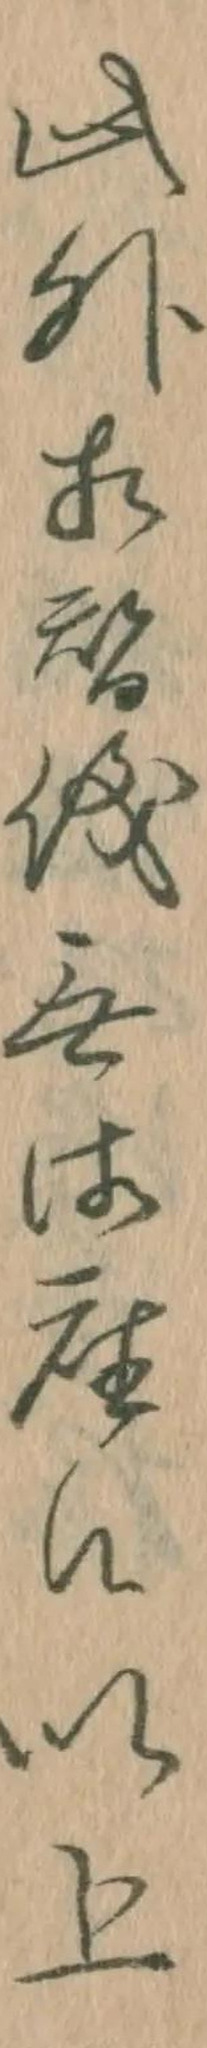此外相替儀無御座候以上
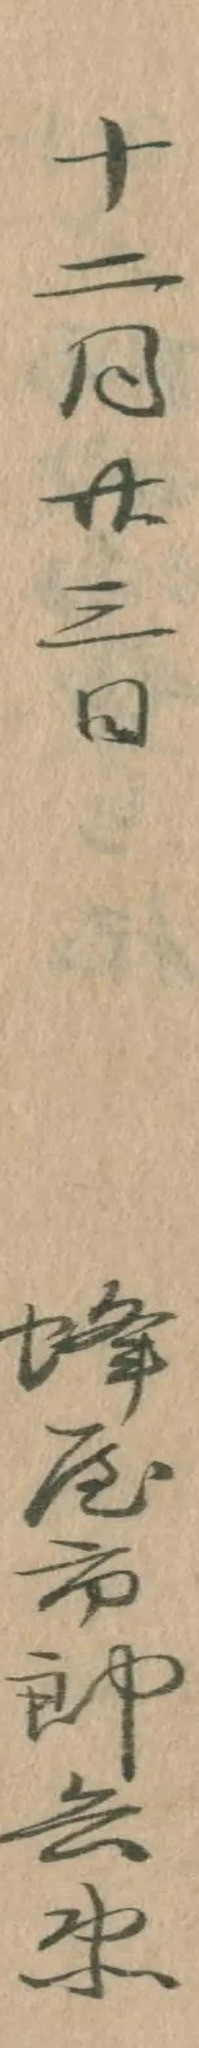十二月廿三日蜂屋市郎兵衛
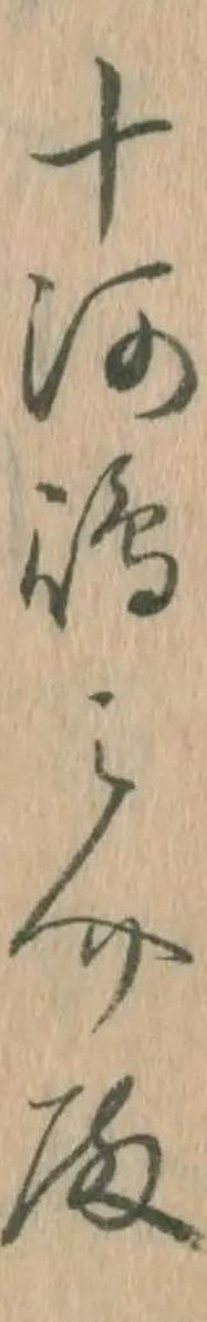十河島之人殿
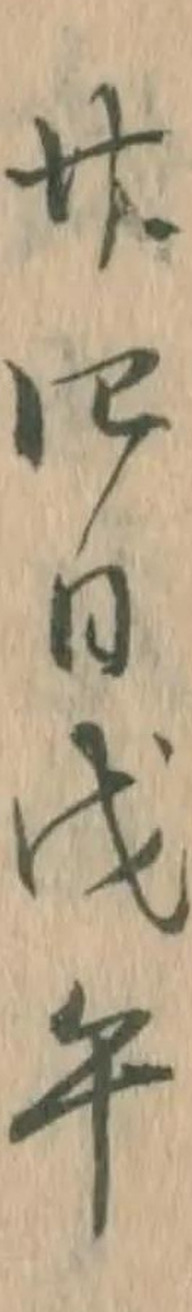廿四日戌午
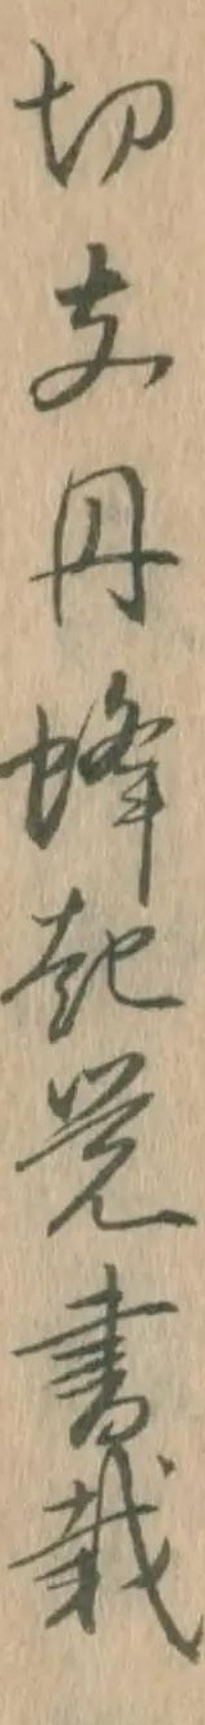切支丹蜂起覚書載
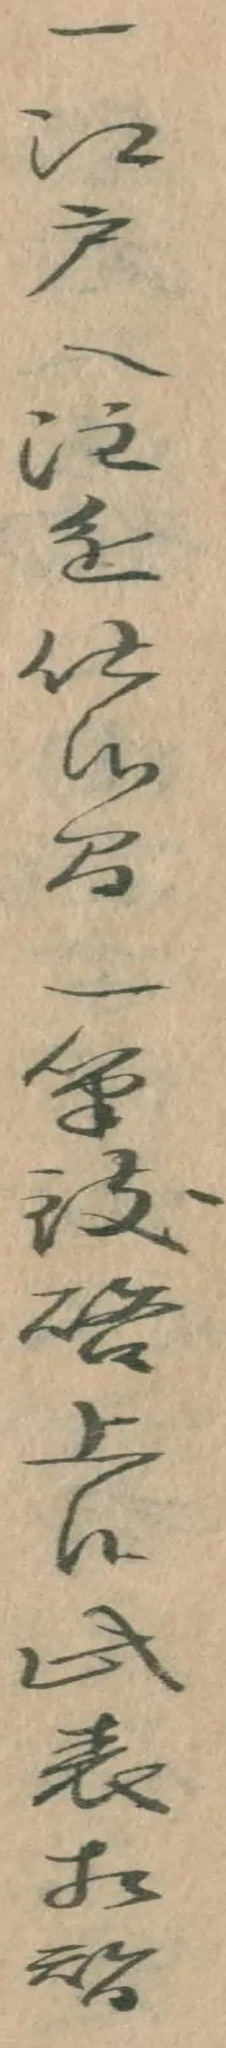一江戸へ注進仕候間一筆致啓上候此表相替
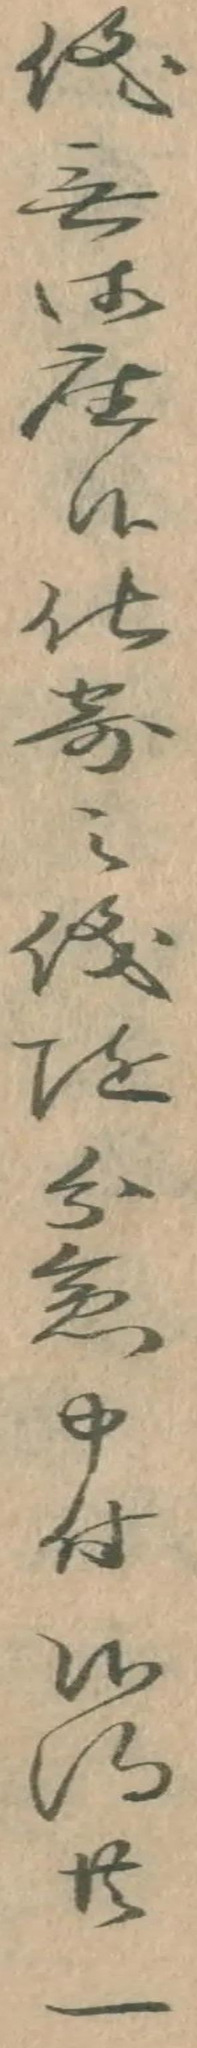儀無御座候仕寄之儀随分急申付候得共一
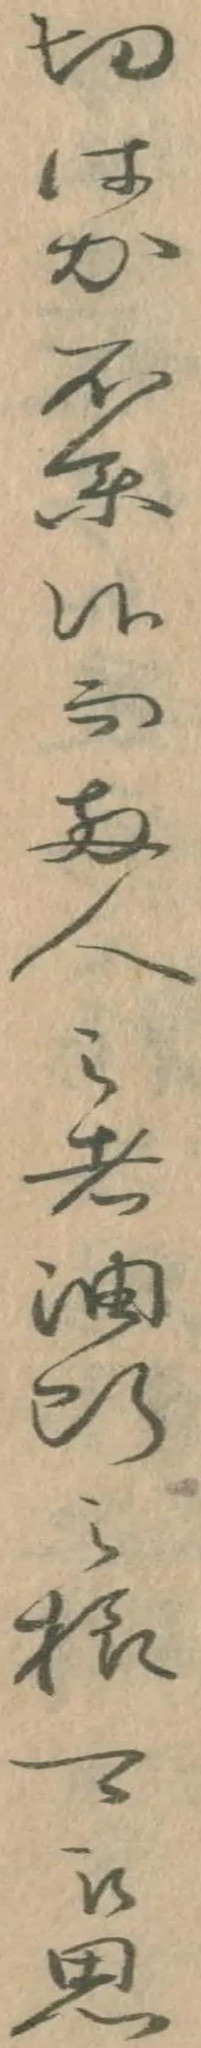切御か不参候而両人之者油断之様可被思

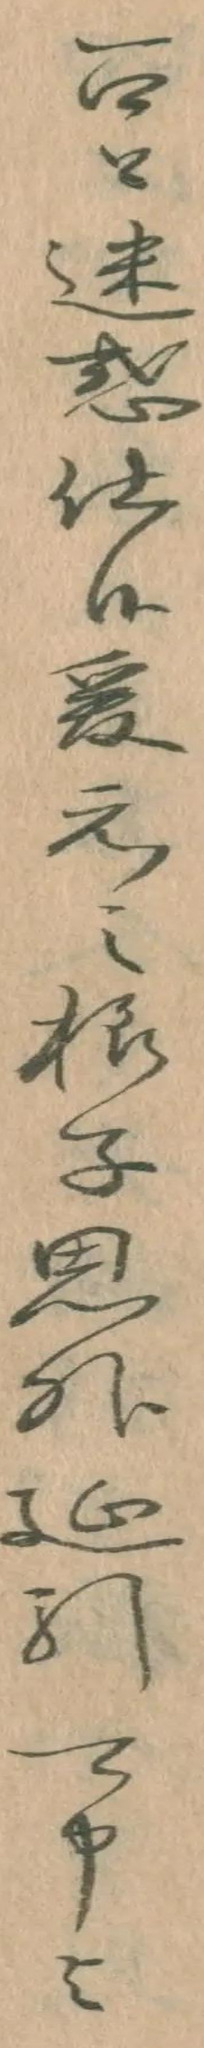召と迷惑仕候爰元之様子思外延引可申与
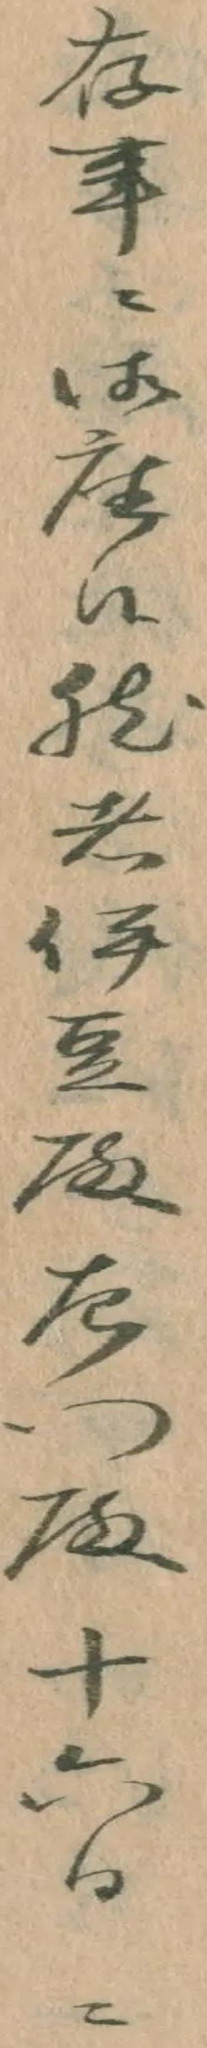存事に御座候然者伊豆殿左門殿十六日に
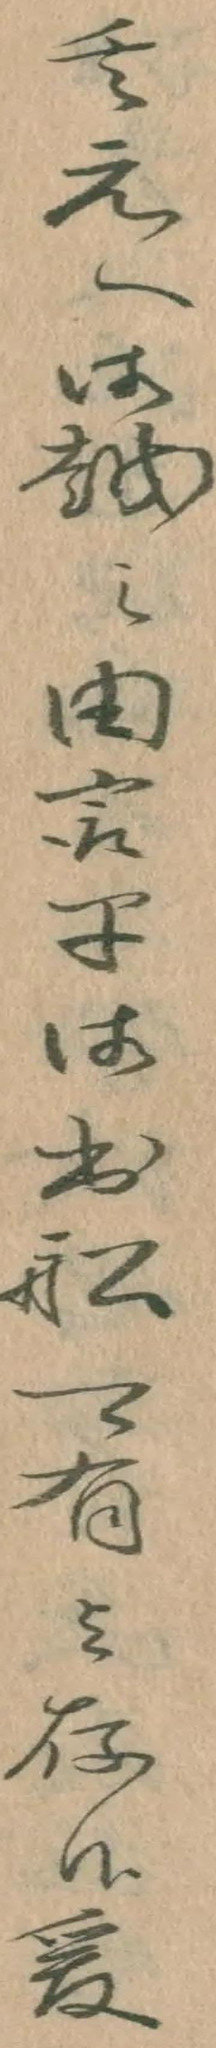其元へ御越之由最早御出舩可有与存候爰
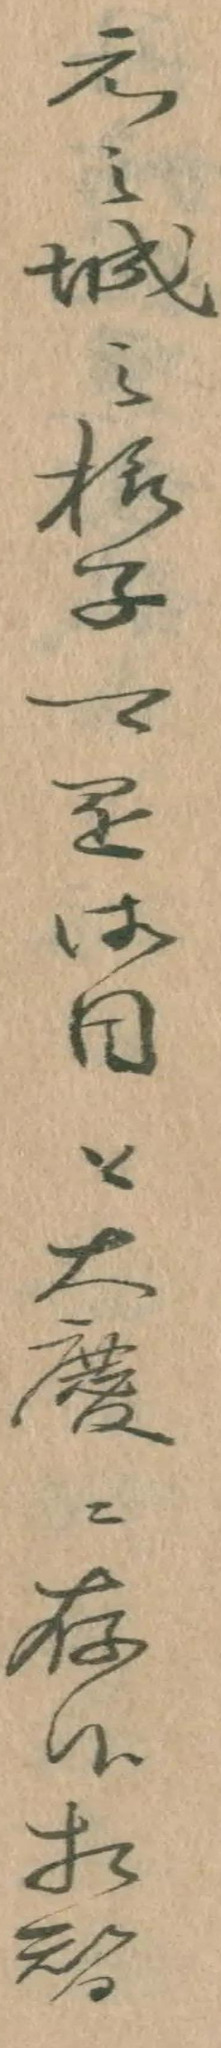元之城之様子可懸御目と大慶に存候相替
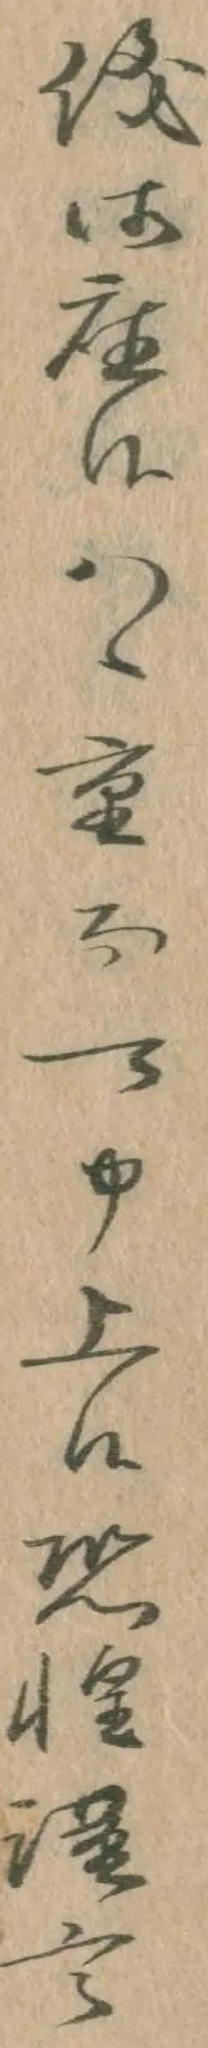儀御座候はゝ重而可申上候恐惶謹言
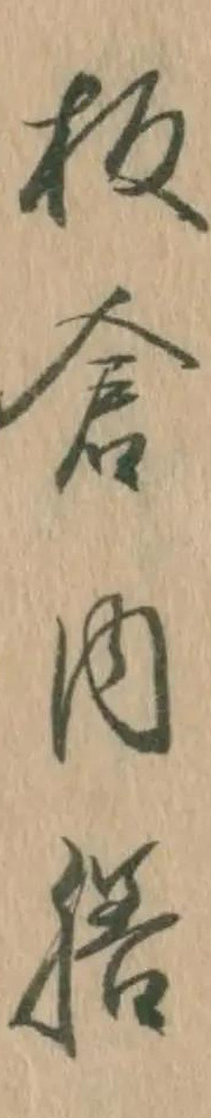板倉内膳
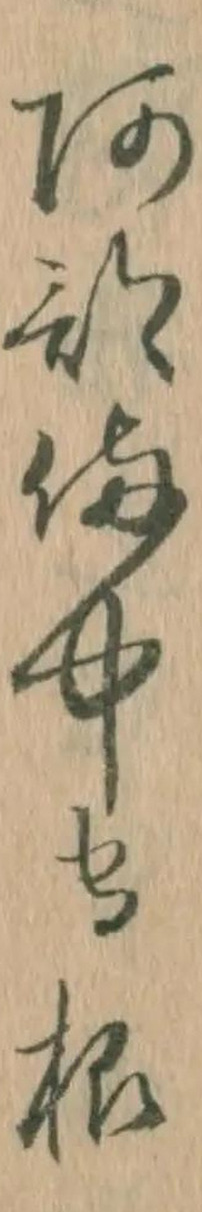阿部備中守様
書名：切支丹御退治記 49巻. [4]
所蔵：国立国会図書館 National Diet Library, JAPAN
